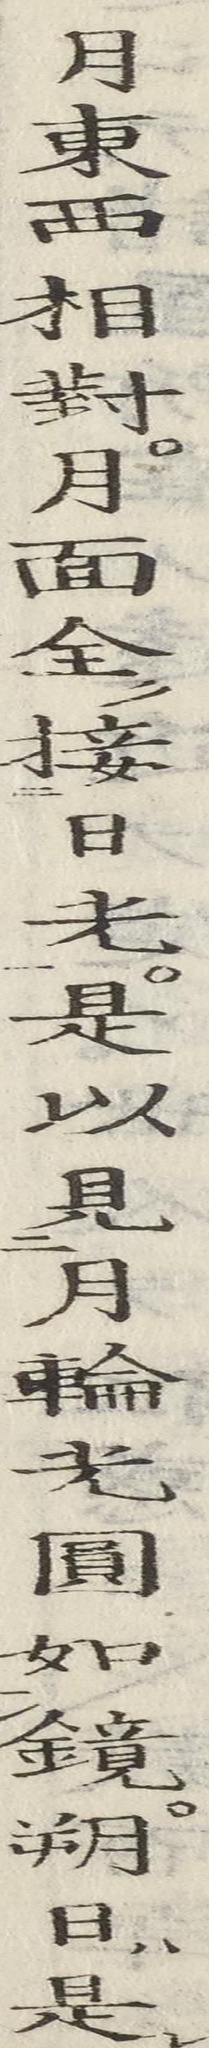月東西相対。月面全接ニ日光。是以見ニ月輪光円如レ鏡。朔日是
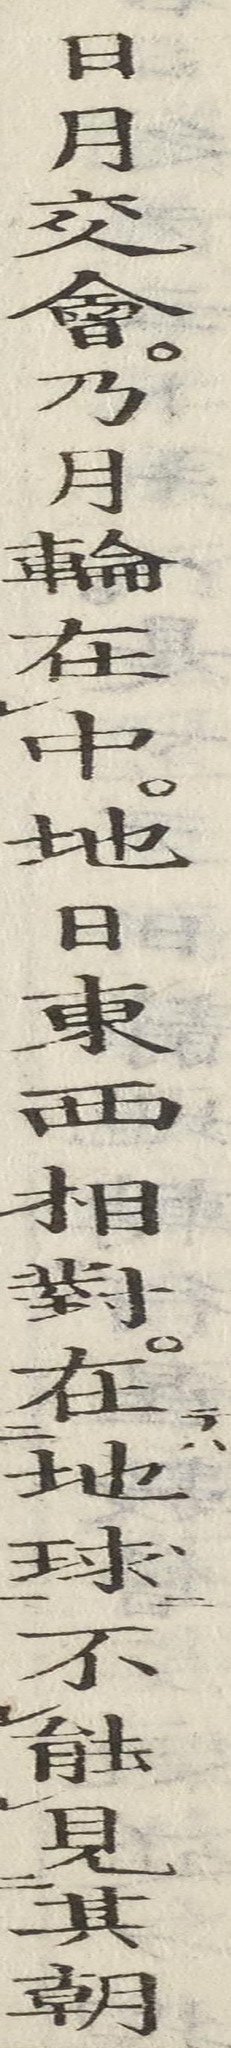日月交会。乃月輪在中。地日東西相対。在ニ地球不能見ニ其朝
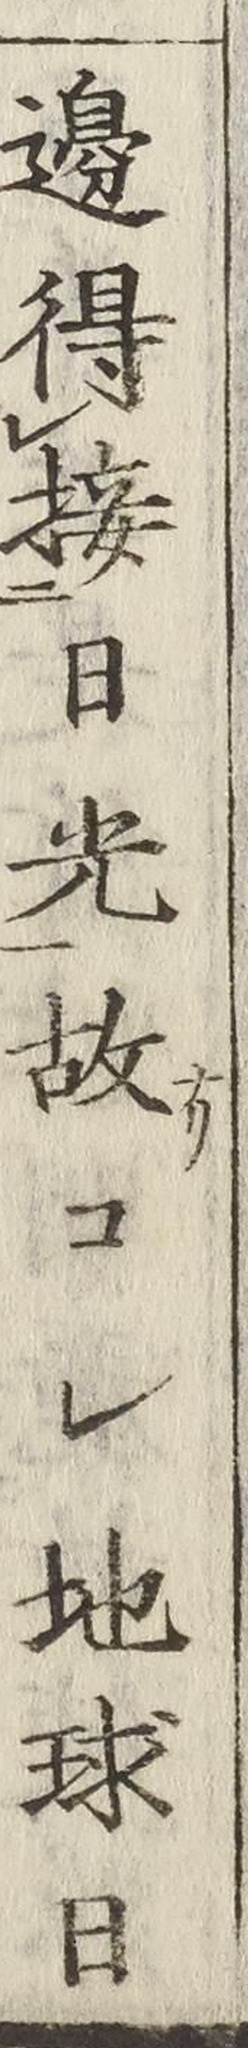返得接ニ日光故地球日
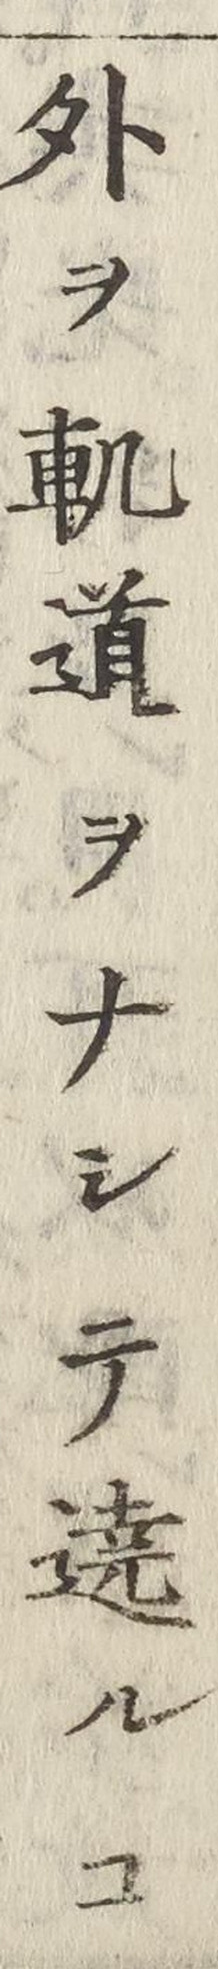外ヲ軌道ヲナシテ遶ルコ
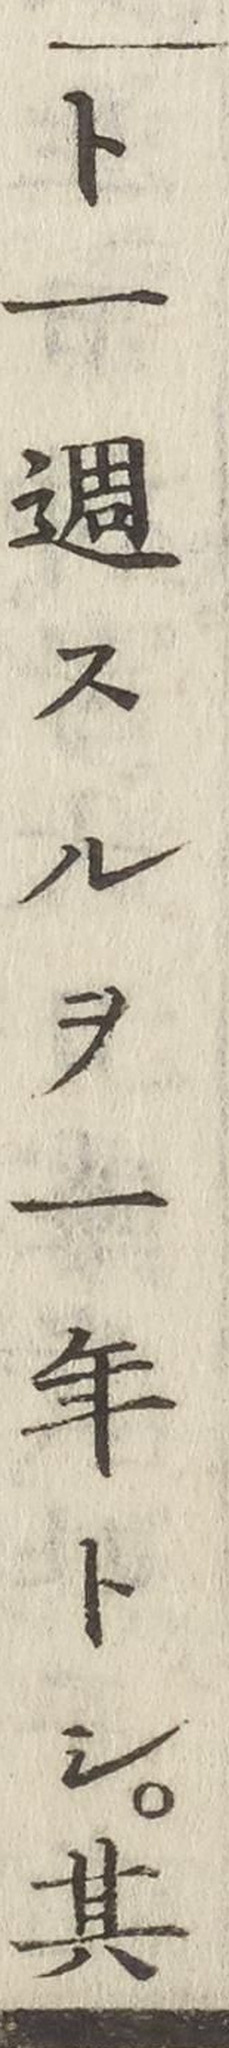ト一週スルヲ一年トシ。其
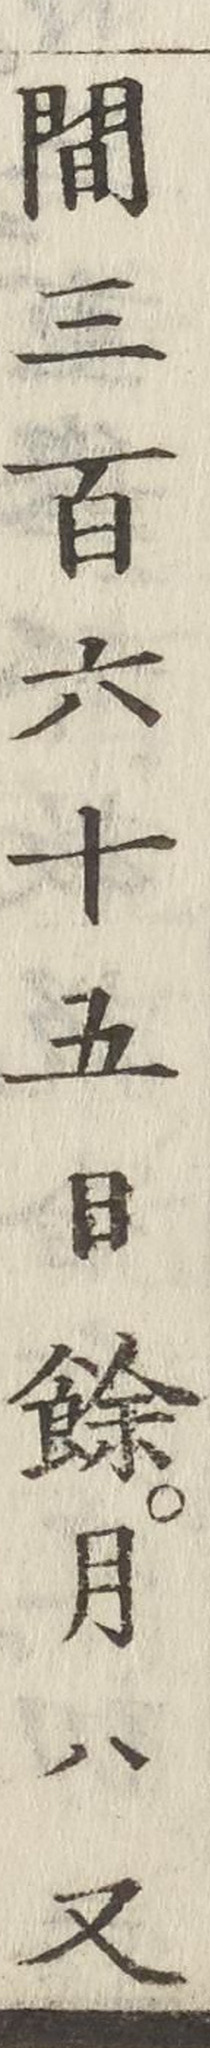間三百六十五日余。月ハ又
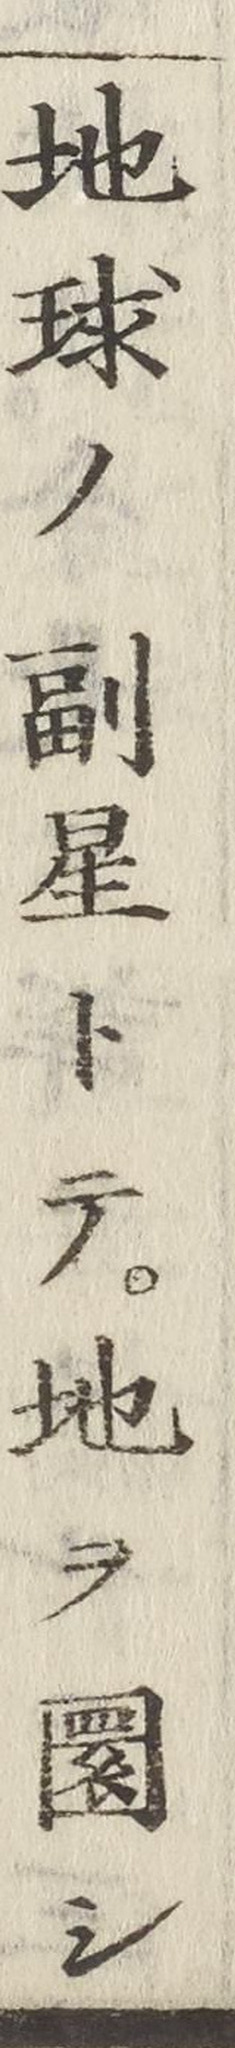地球ノ副星トテ。地ヲ園シ
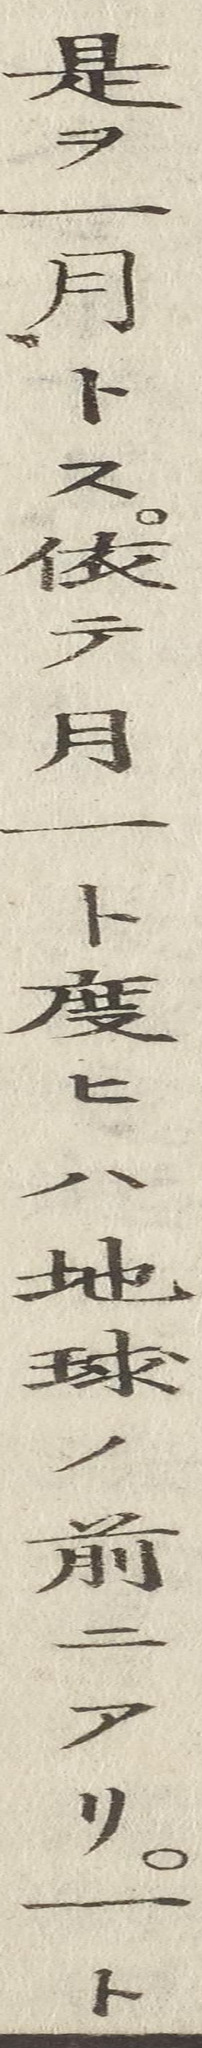是ヲ一月トス。依テ月一ト度ヒハ地球ノ前ニアリ。一ト
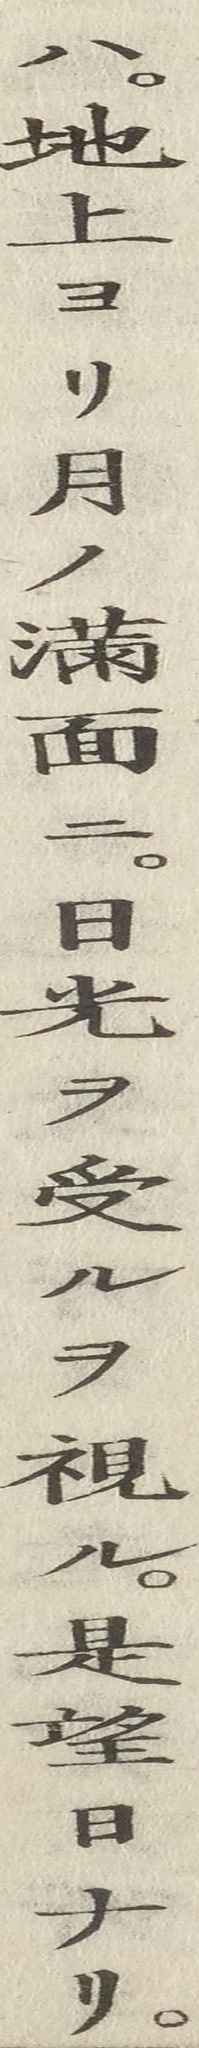ハ。地上ヨリ月ノ満面ニ。日光ヲ受ルヲ視ル。是望日ナリ。
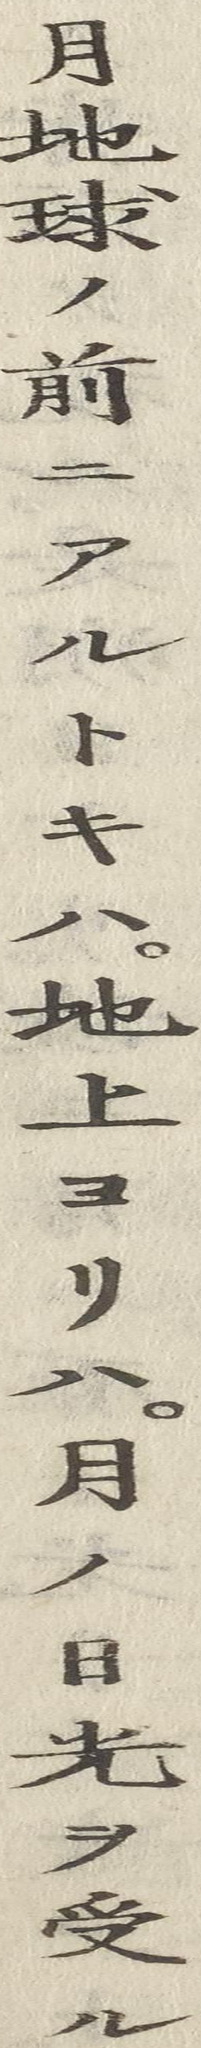月地球ノ前ニアルトキハ。地上ヨリハ。月ノ日光ヲ受ル

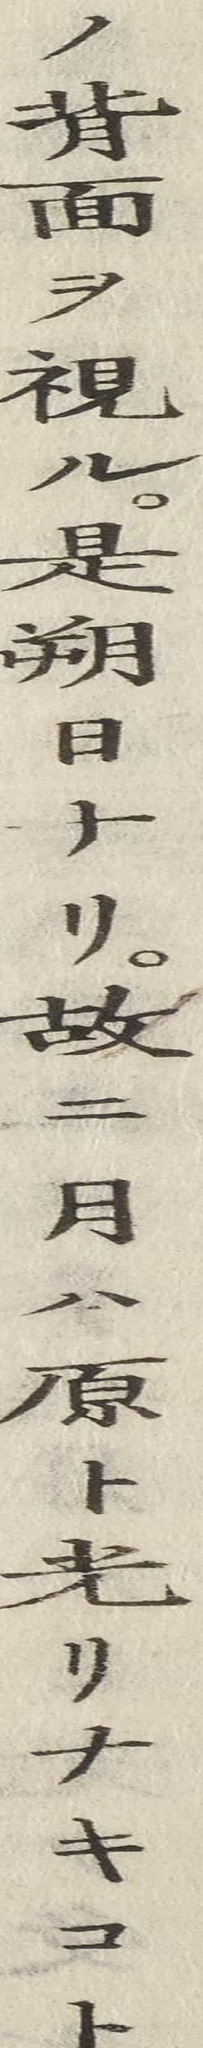ノ背面ヲ視ル。是朔日ナリ。故ニ月ハ原ト光リナキコト。
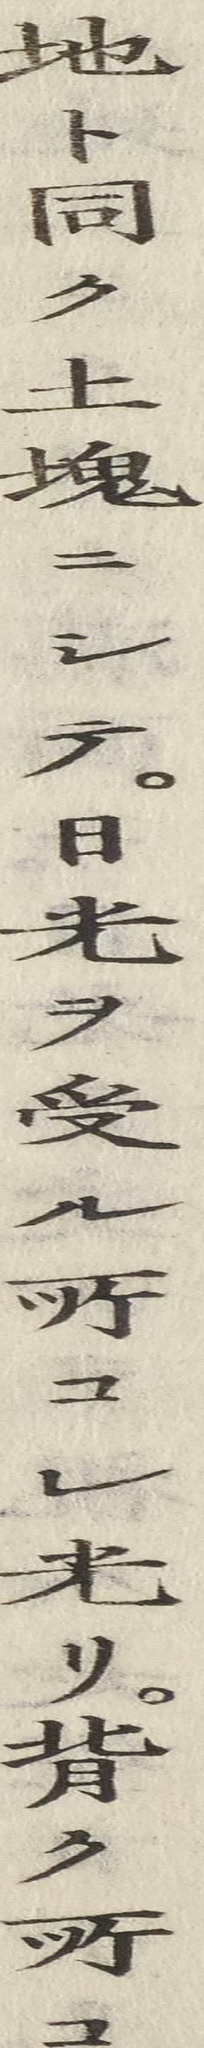地ト同ク土塊ニシテ。日光ヲ受ル所コレ光リ。背ク所コ
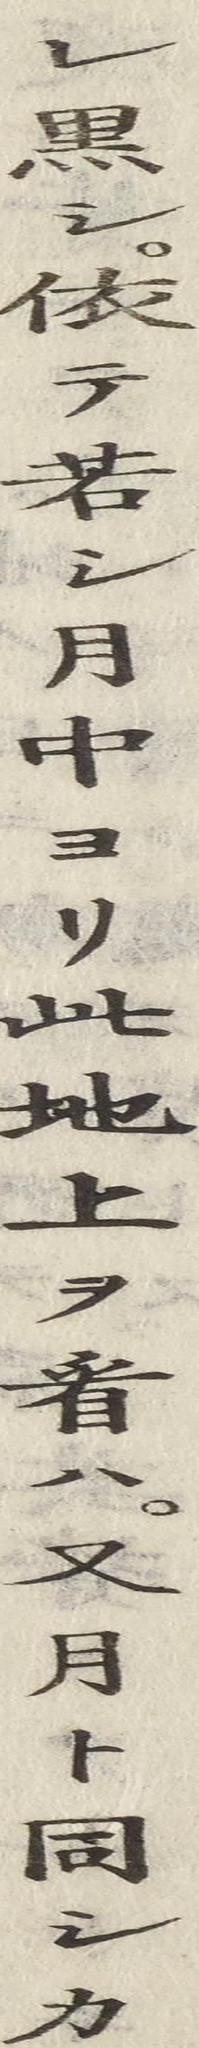レ黒シ。依テ若シ月中ヨリ此地上ヲ看ハ。又月ト同シカ
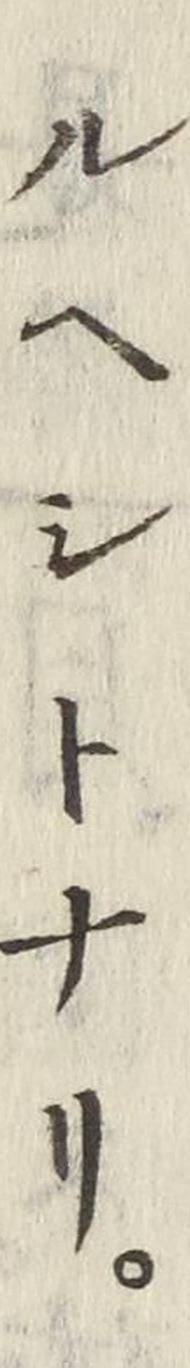ルヘシナリ。
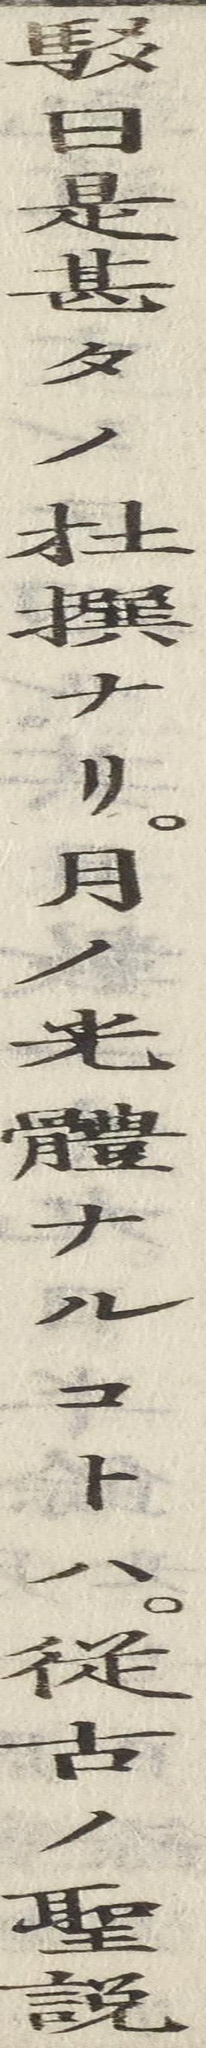駁曰是甚タノ杜撰ナリ。月ノ光体ナルコトハ。従古ノ聖説
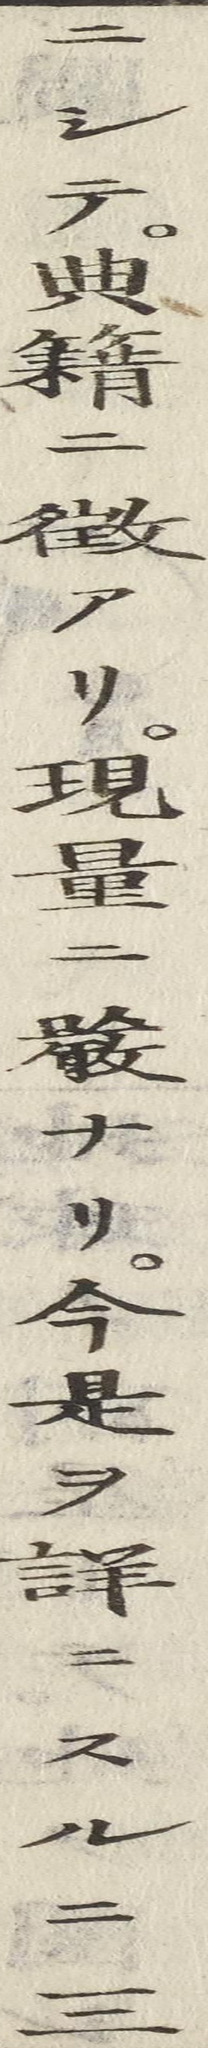ニシテ。典籍ニ徴アリ。現量ニ厳ナリ。今是ヲ詳ニスルニ三
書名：護法新論　二編　下
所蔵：東京大学地震研究所図書室 Earthquake Research Institute Library, The University of Tokyo, JAPAN
